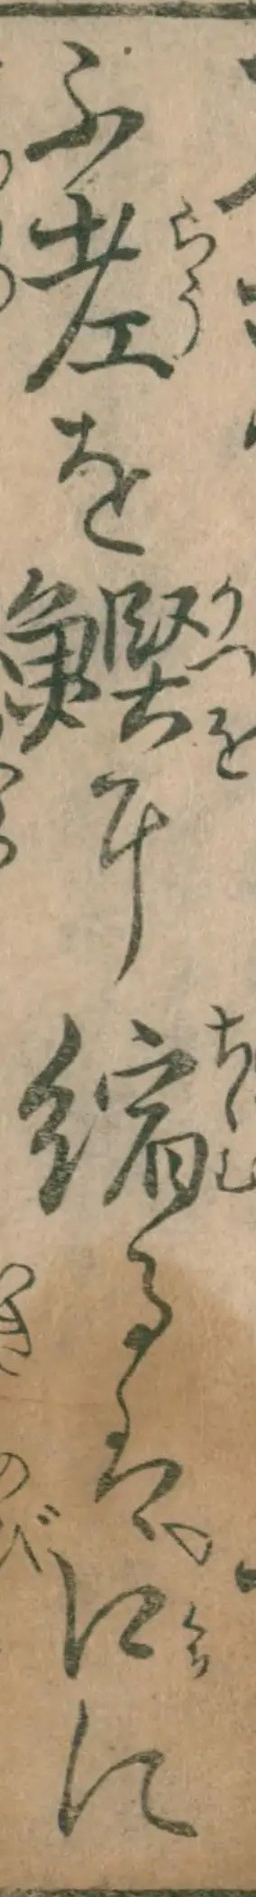ふ老を鰹に縮るは、口に
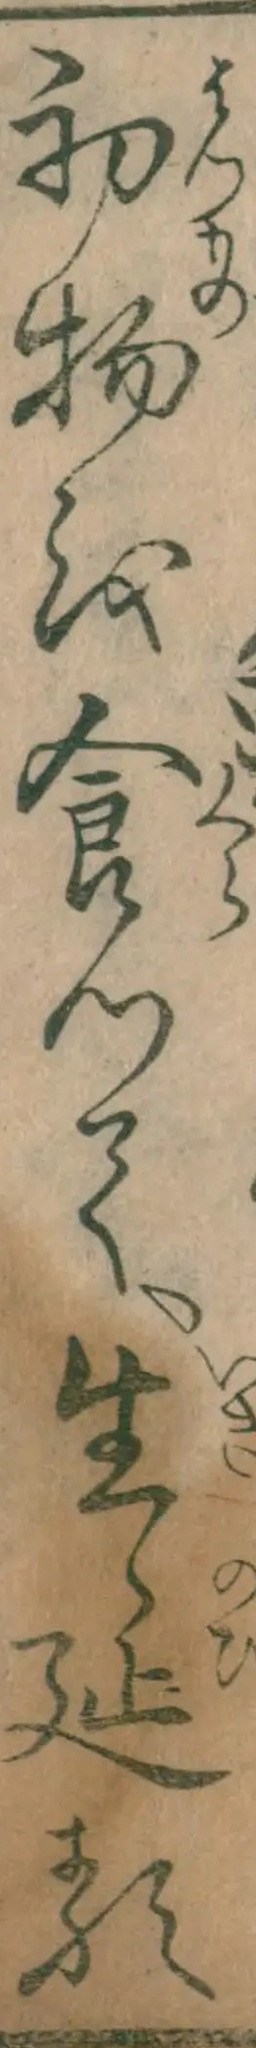初物を食つて、生延る

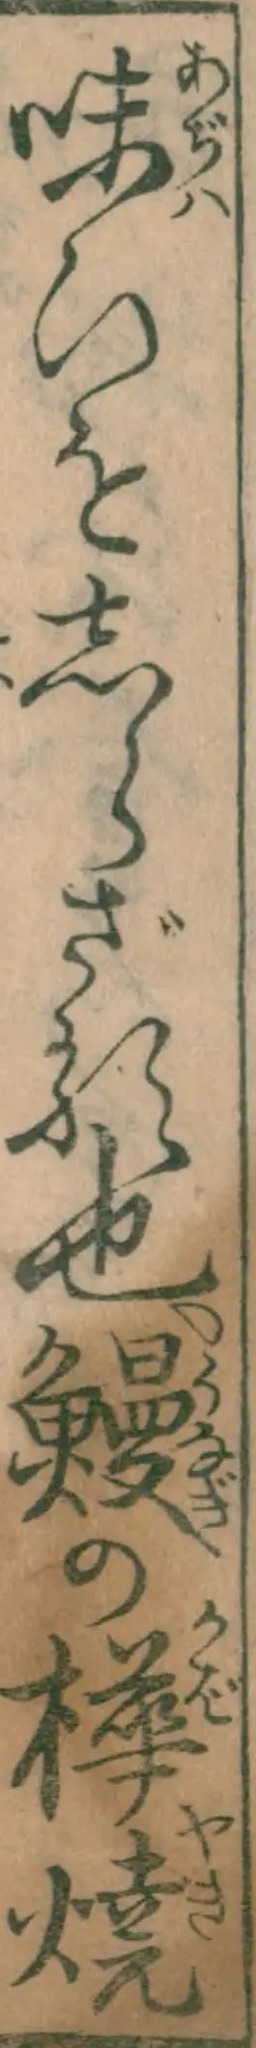味ひをしらざる也、鰻の樺焼
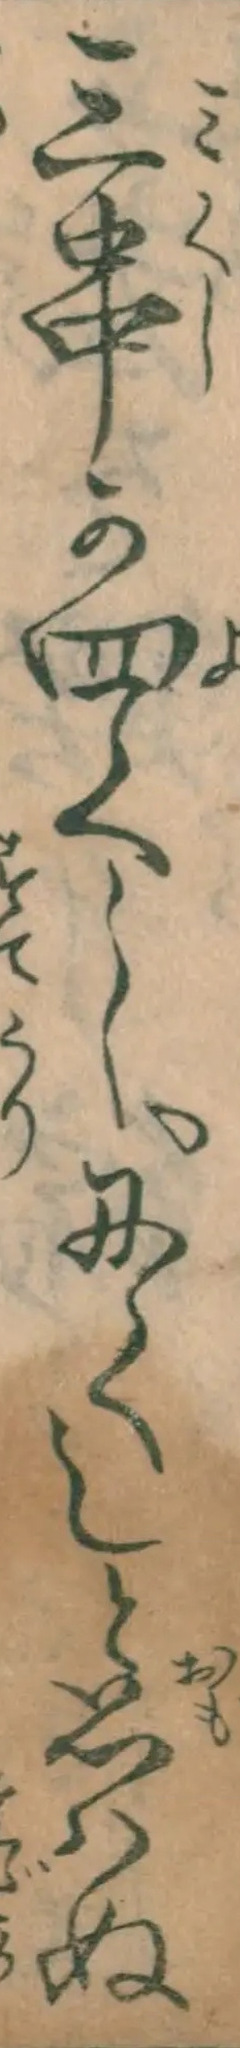三串か四くし、にくしと思はぬ
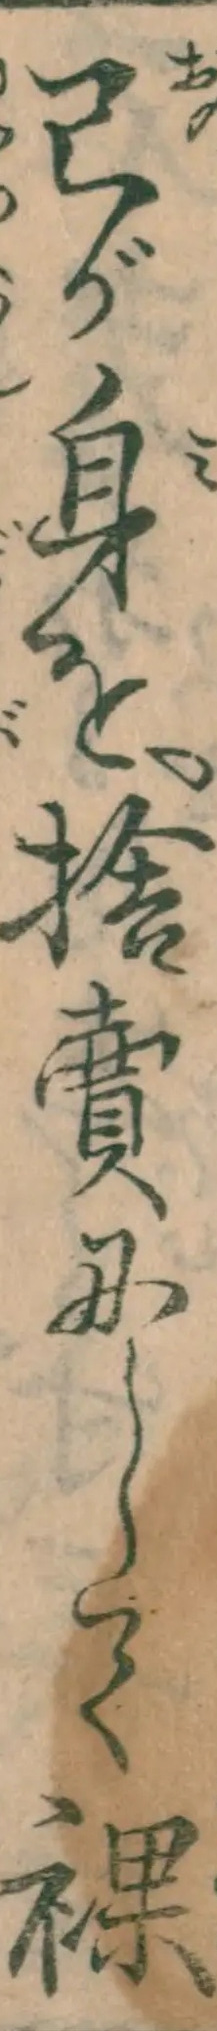己が身を、捨売にして裸
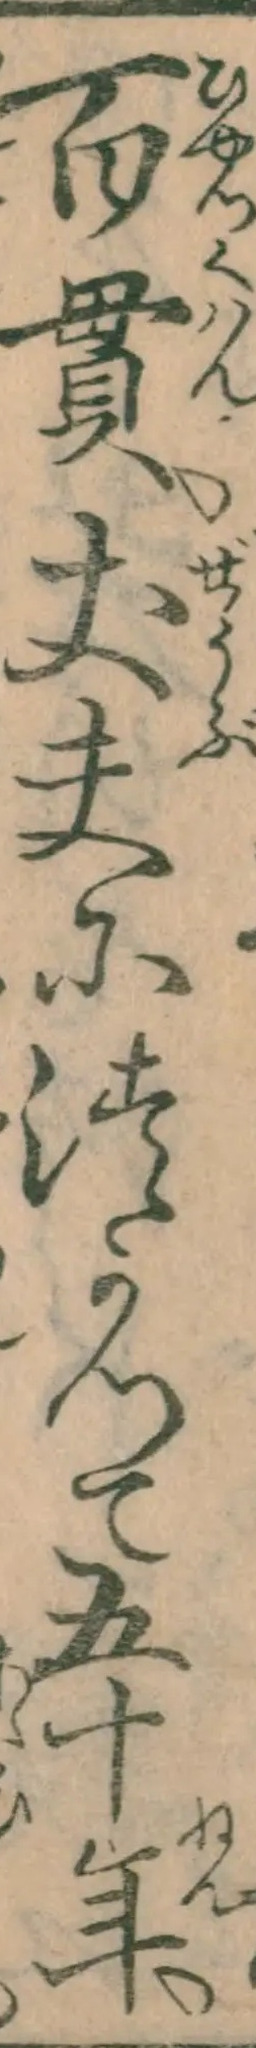百貫、丈夫につかつて五十年、
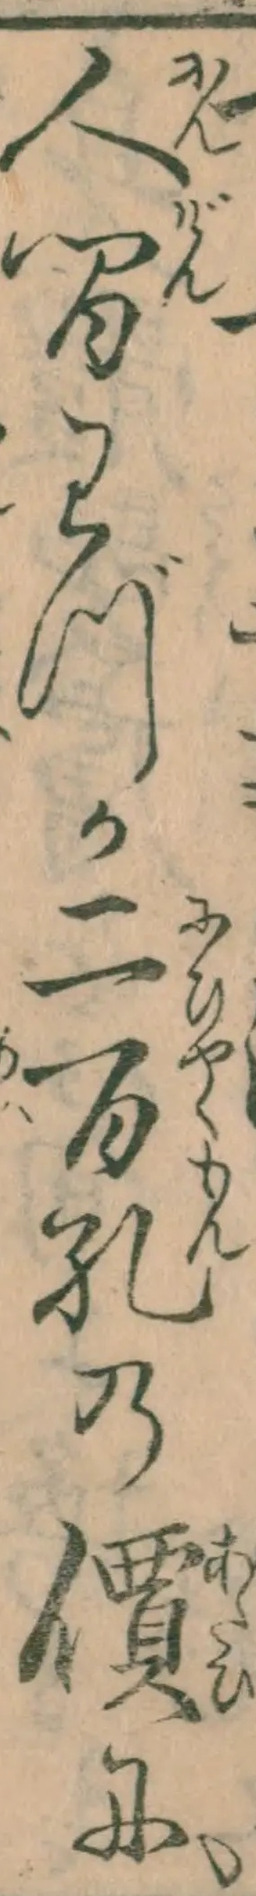人間わづか二百孔の價に、
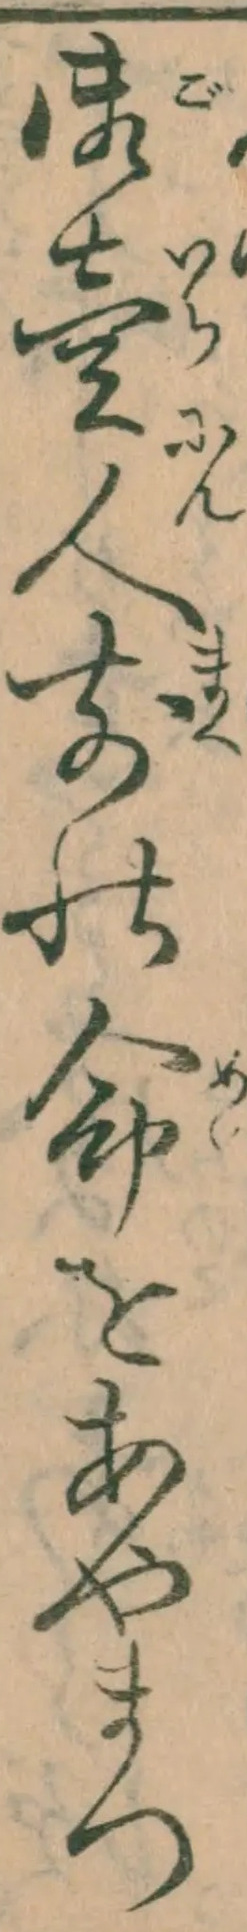御壱人前の命をあやまつ
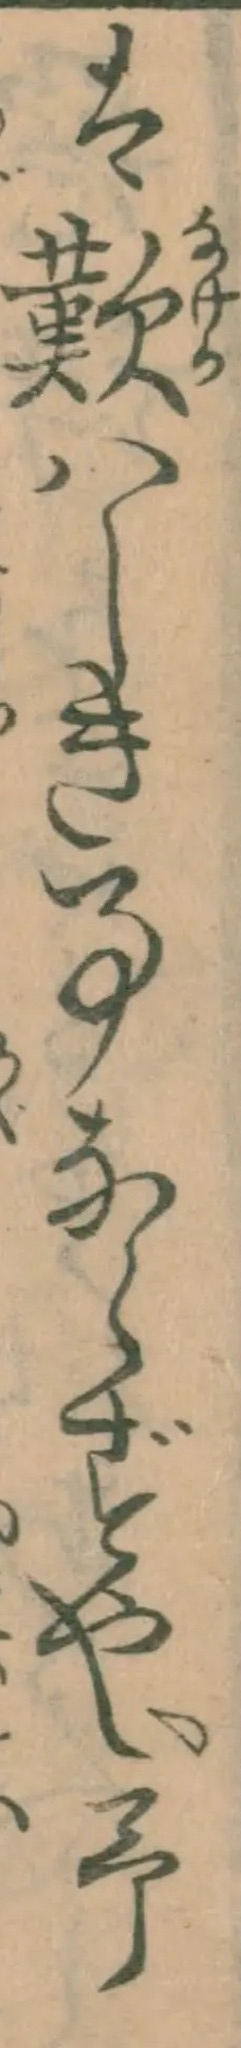は嘆はしき事ならずや、予
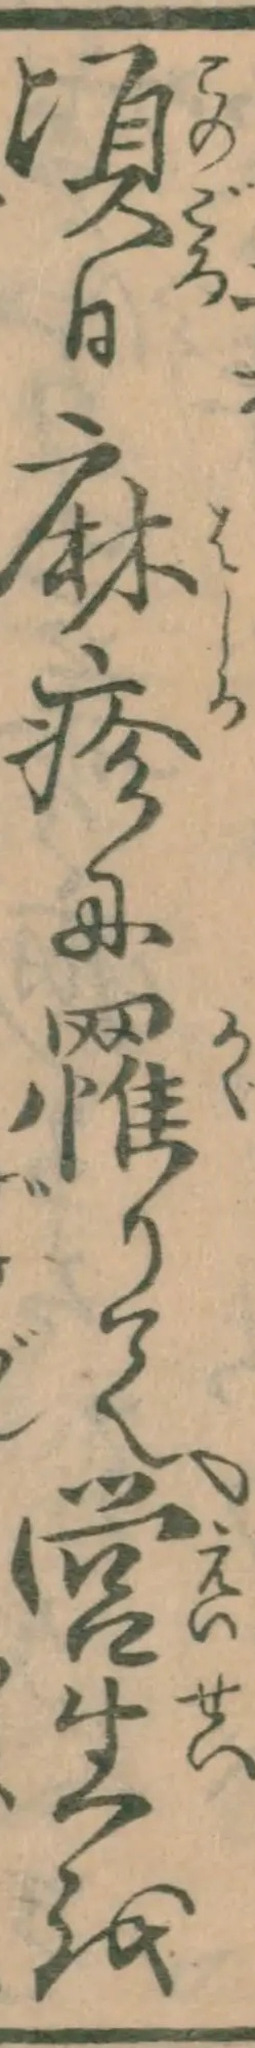頃日麻疹に罹りて、営生を
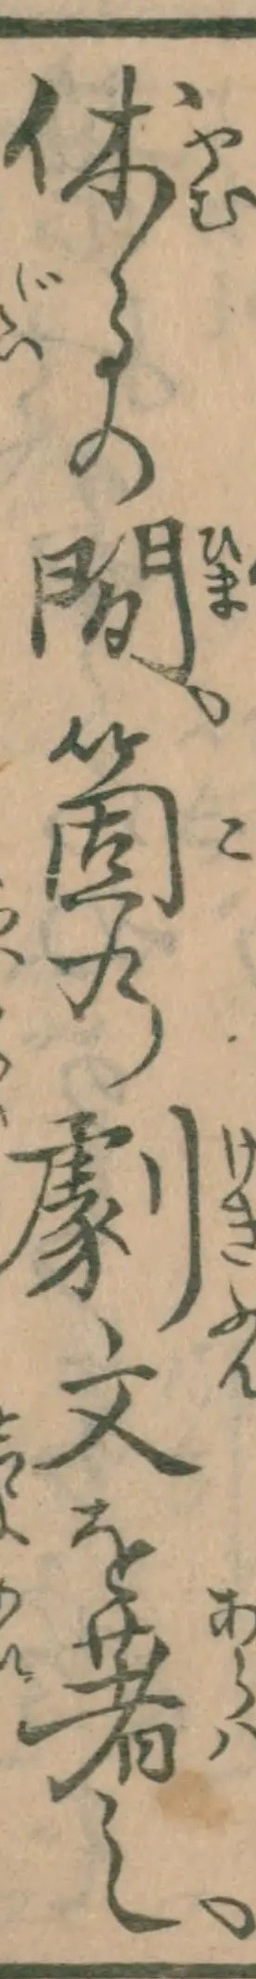休るの間？、箇の劇文を著し、
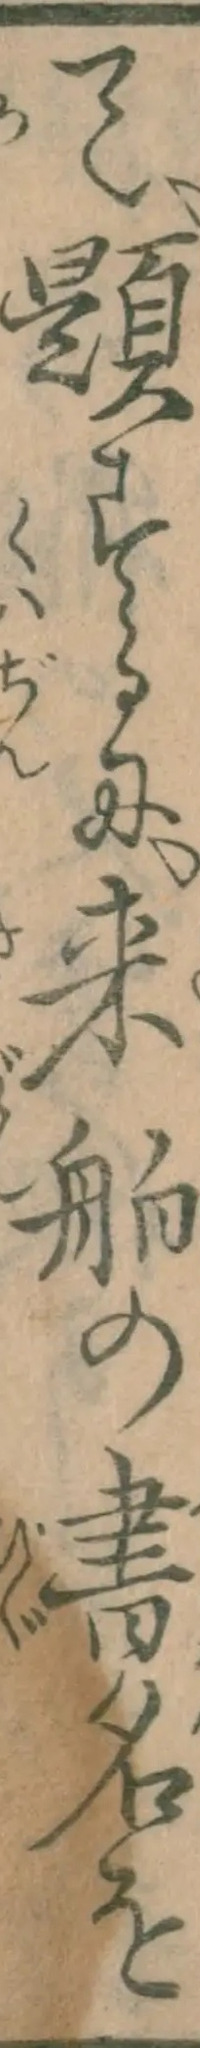て、題するに、来舶の書名を
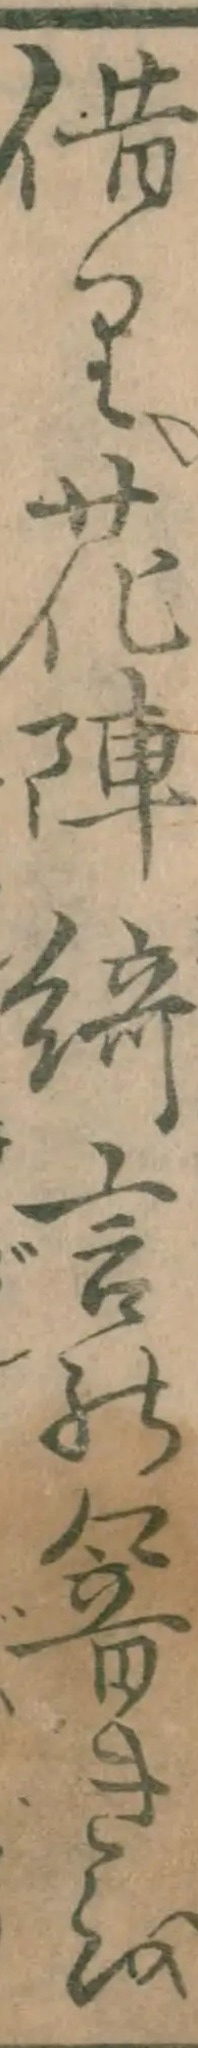借り、花陣綺言の響きを
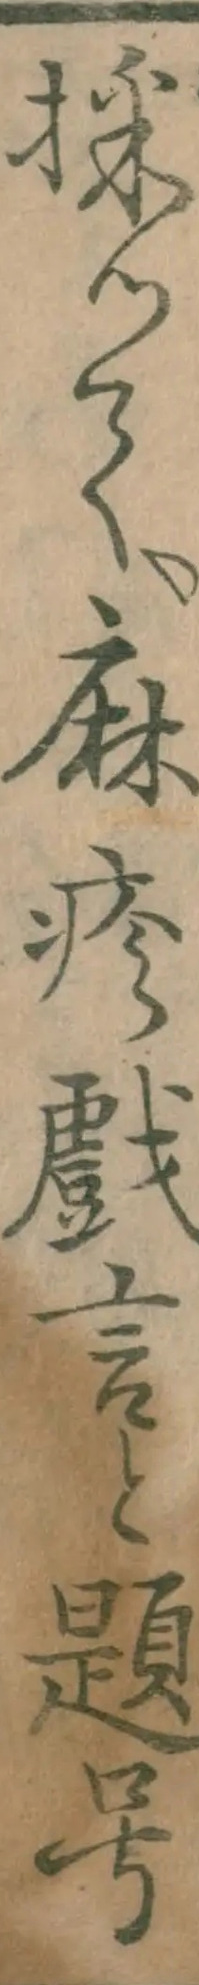採つて、麻疹戯言と題号

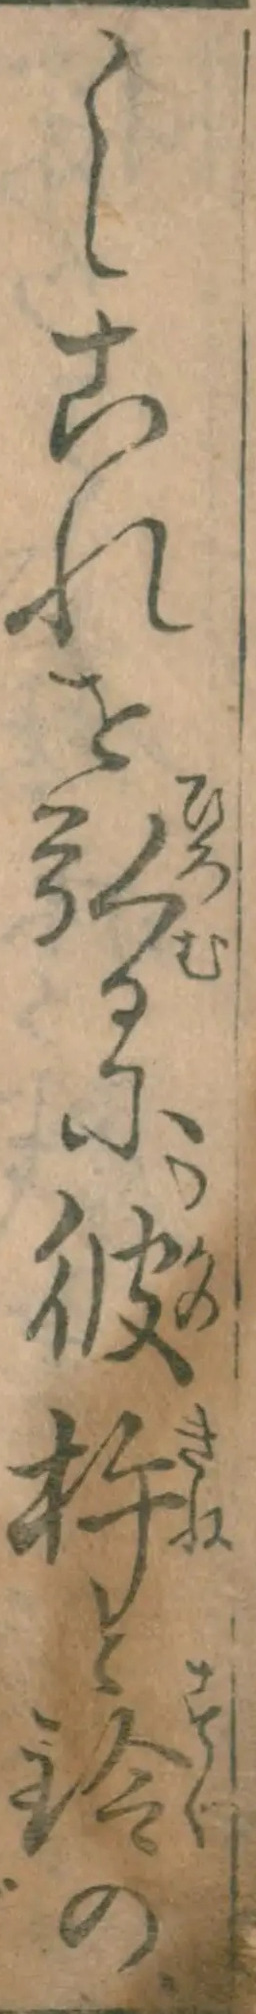しこれを弘るに、彼杵と鈴の、
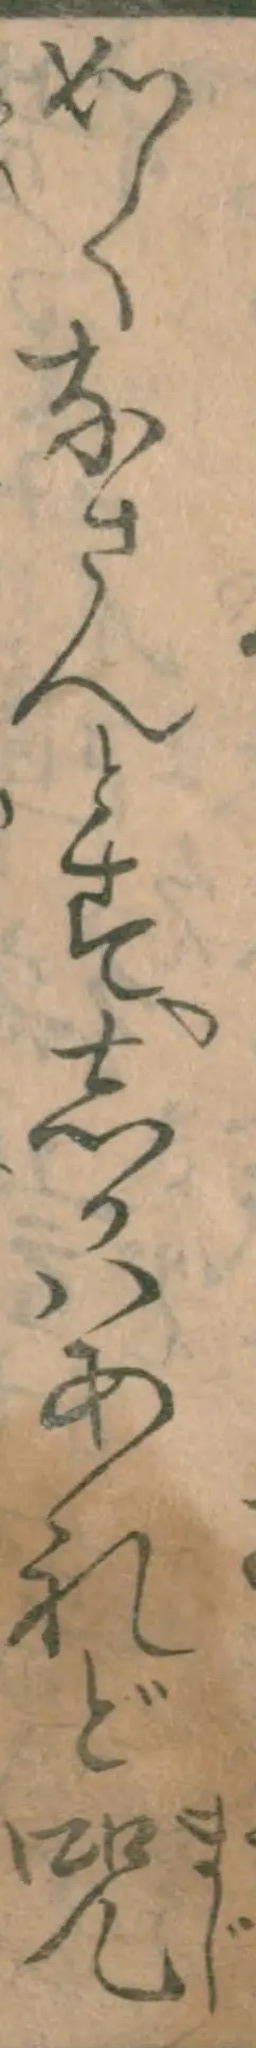如くなさんとす、しかはあれど呪
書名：麻疹戯言
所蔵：国立国会図書館 National Diet Library, JAPAN
